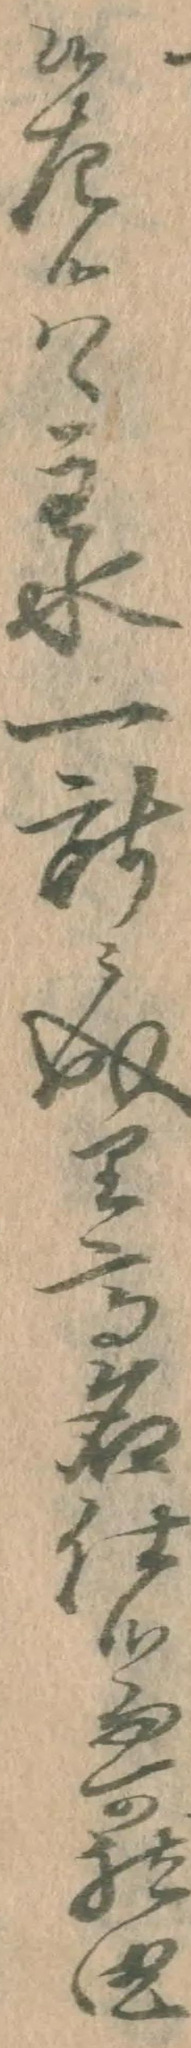候左候はゝ主水一所に成里高名仕候而可然由
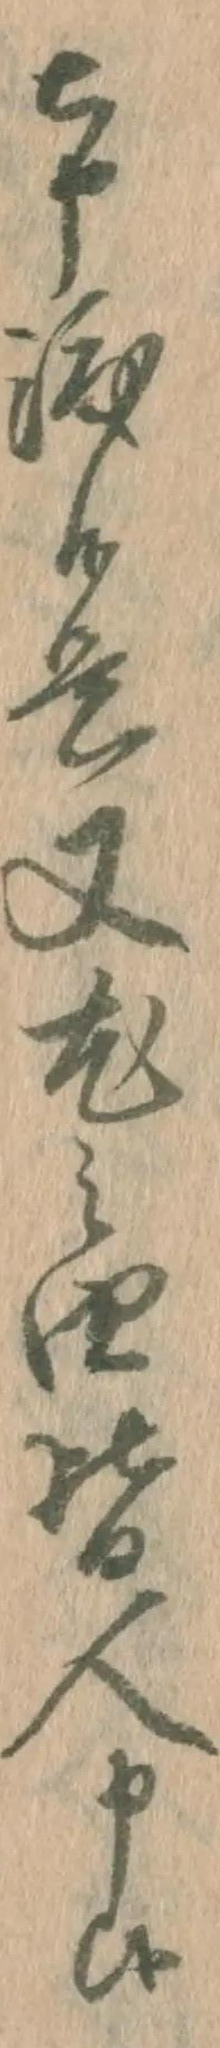被申渡候是又尤之由皆人申候
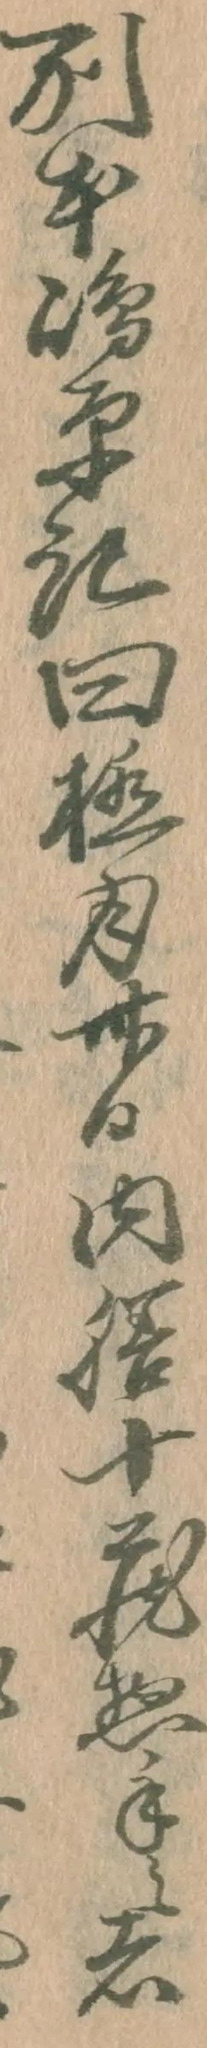別本島原記曰極月丗日内膳十蔵惣手之者
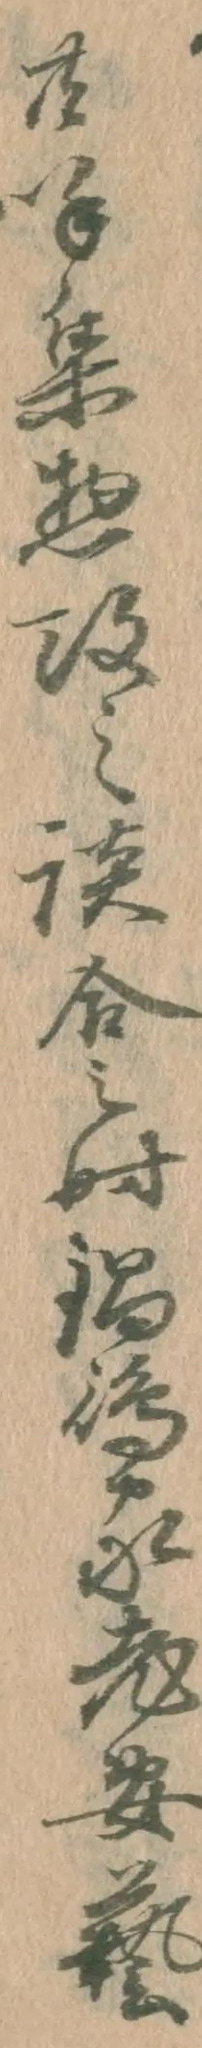共呼集惣攻之談合之時鍋島家老安芸
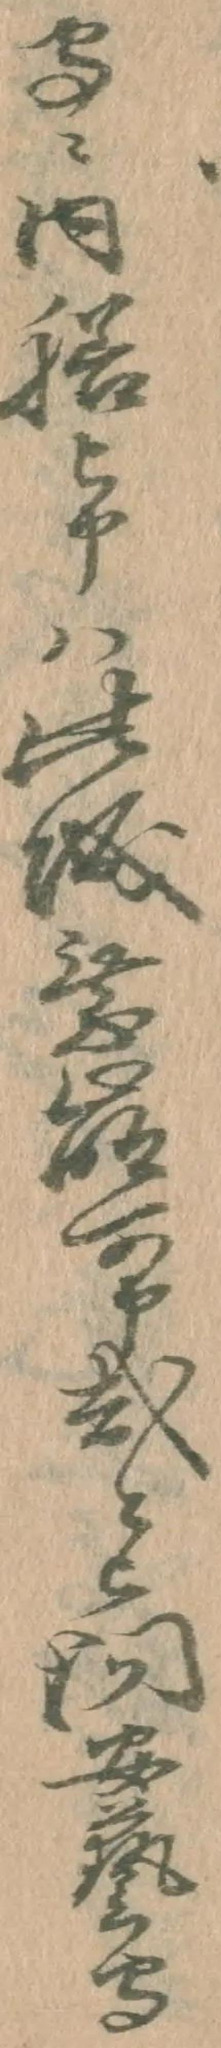守に内膳被申は此城乗崩可申哉と被問安芸守
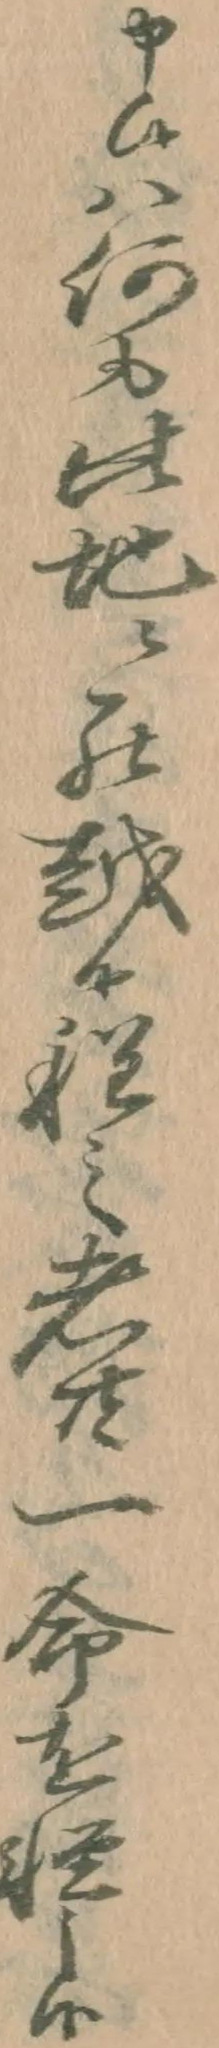申候は何も此地に罷越候程之者共一命を軽し候
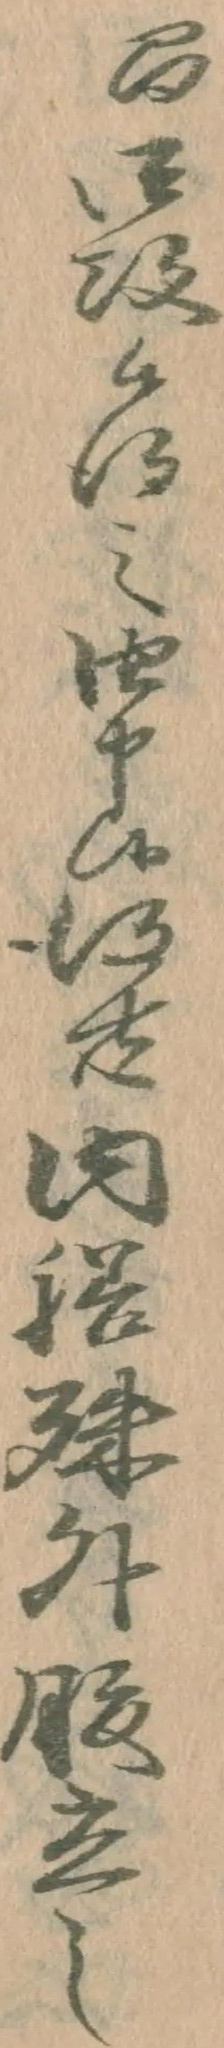間御攻候得之由申候得共内膳殊外腹立し
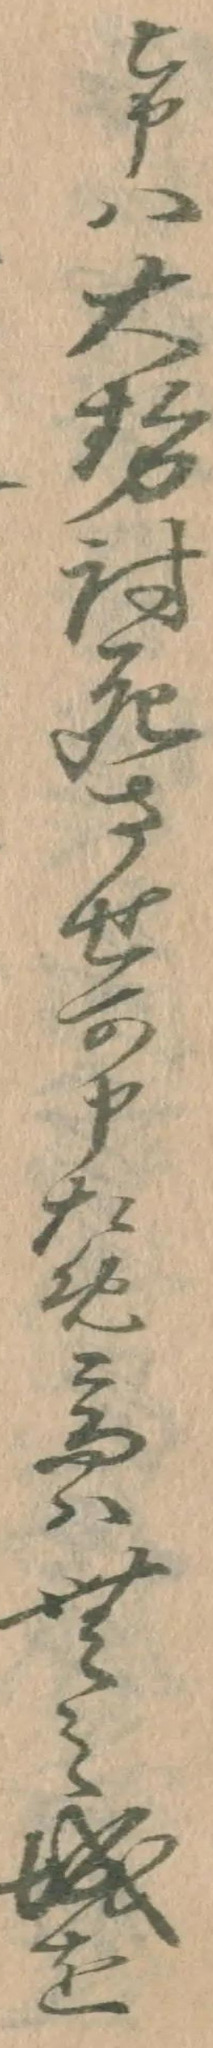被申は大勢討死させ可申た免に而は無之城を
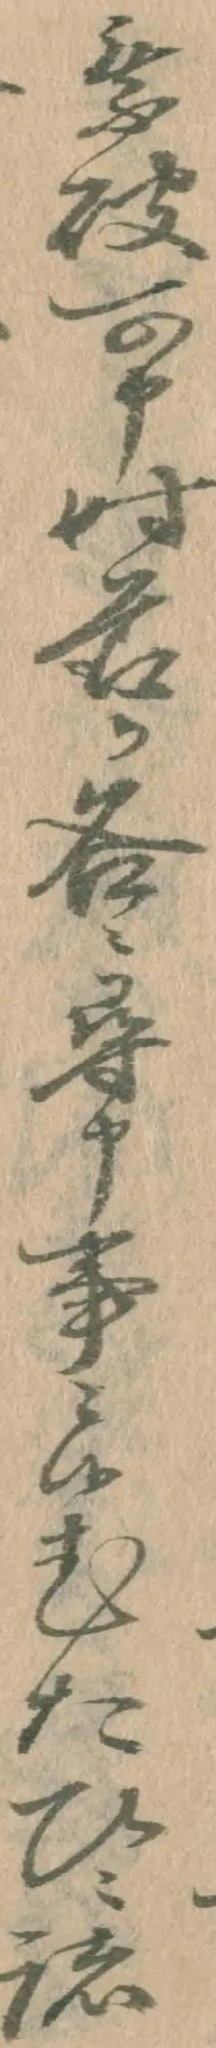乗破可申時節か各に尋申事に候むたひに諸
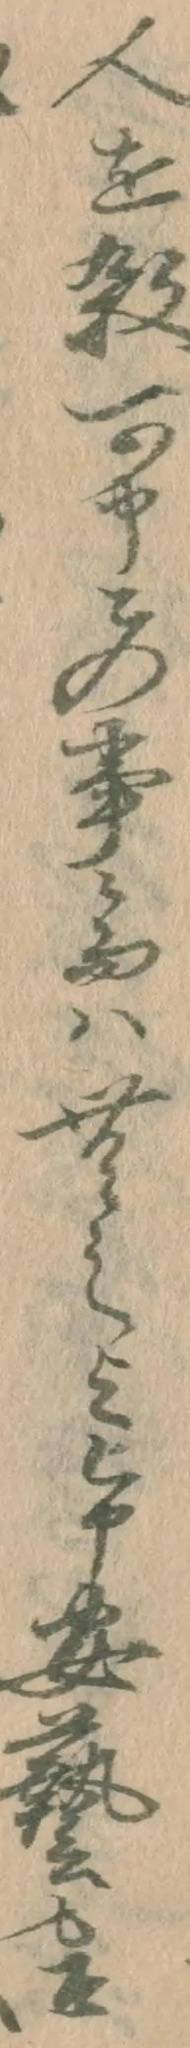人を殺可申との事に而は無之与被申安芸も御
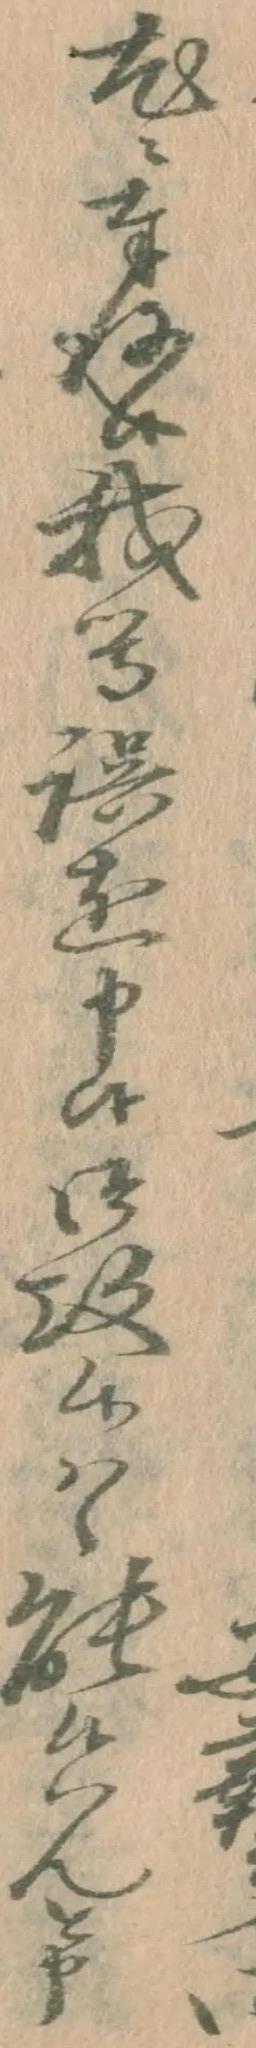尤に奉存候我等誤を申候御攻候はゝ能候はんと申
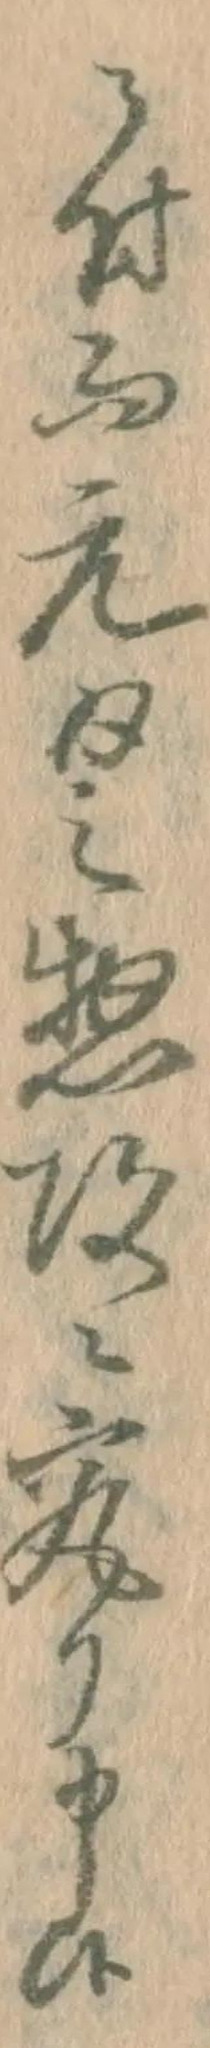に付而元日之惣攻に究り申候
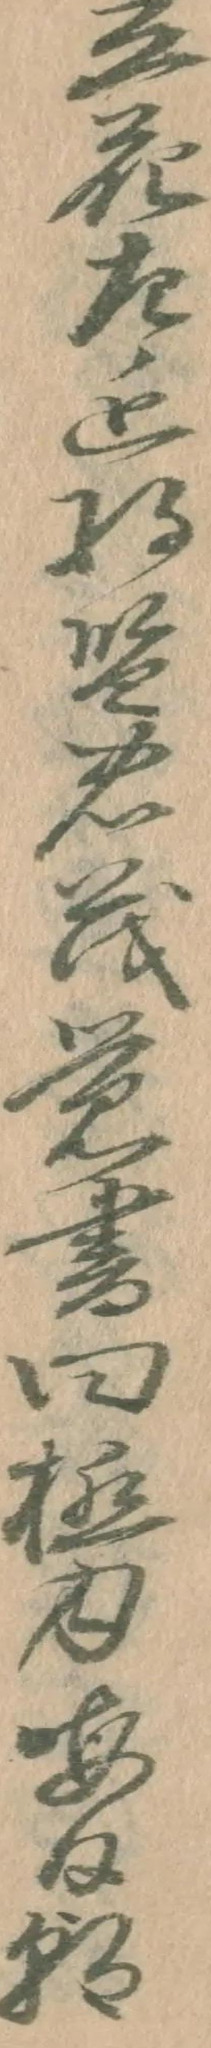立花左近将監忠茂覚書曰極月晦日朝
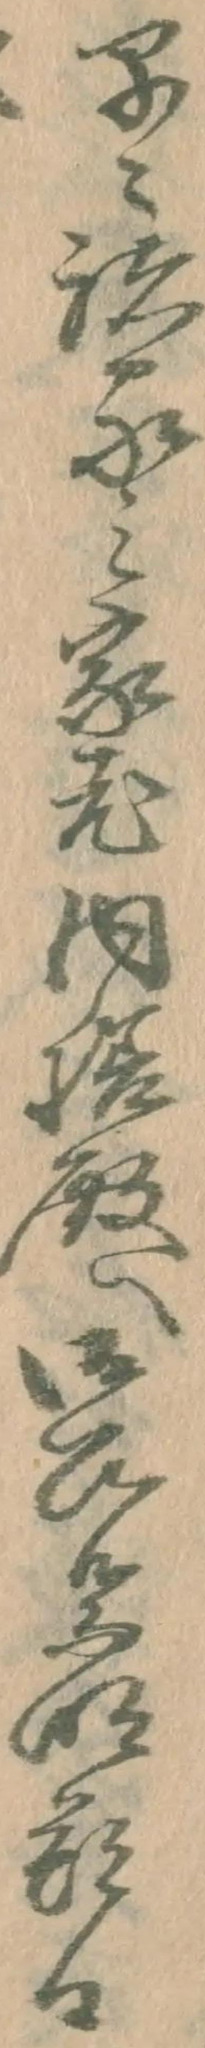早々諸家之家老内膳殿へ御召候而明朔日
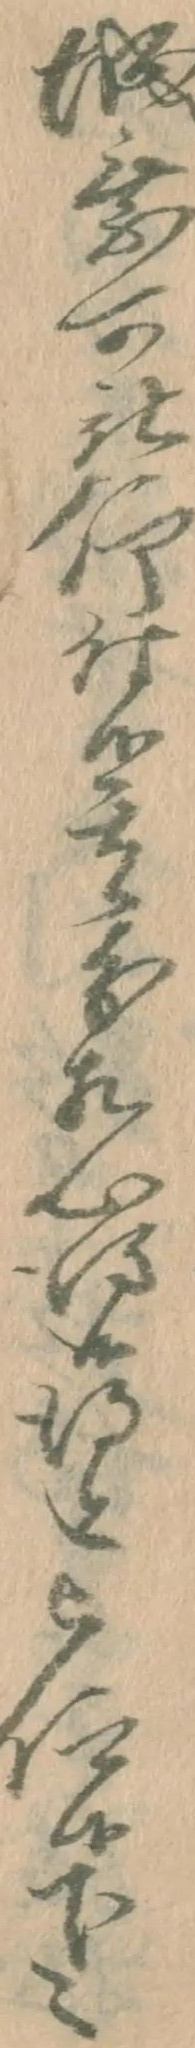城乗可被仰付候其分相心得候得と被仰候下々

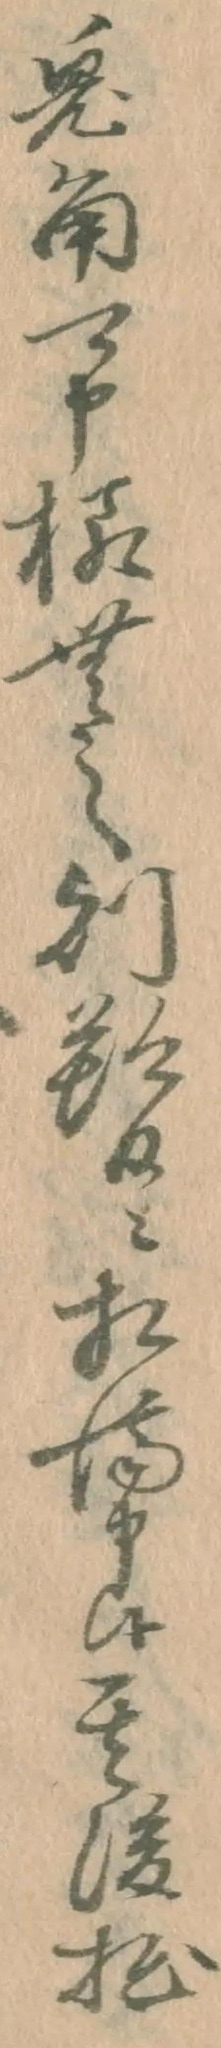兎角可申様無之刻朔日に相備申候其後拙
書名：切支丹御退治記 49巻. [5]
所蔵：国立国会図書館 National Diet Library, JAPAN
